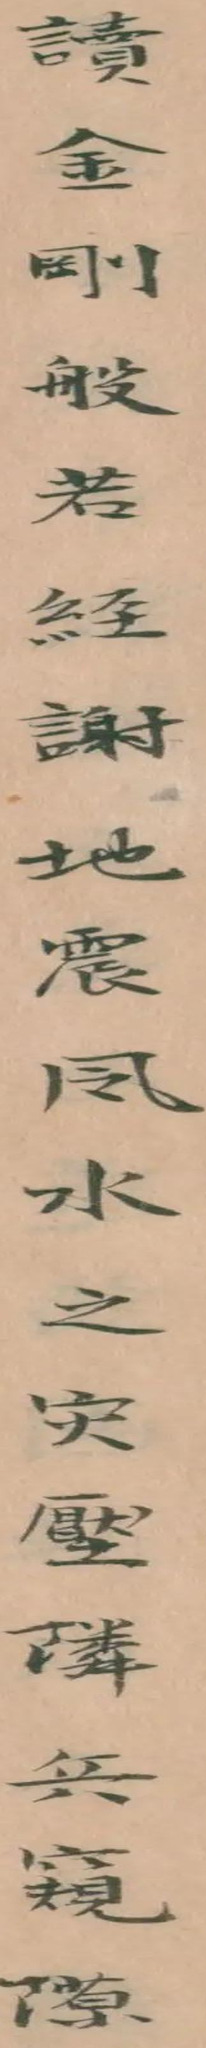読金剛般若経謝地震風水之災圧隣
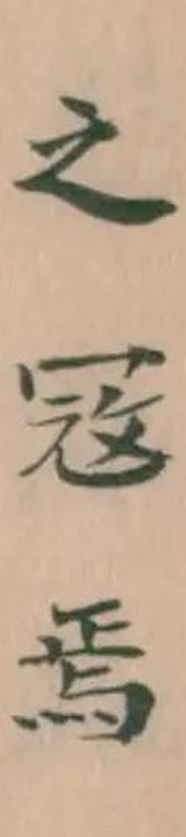之冦焉
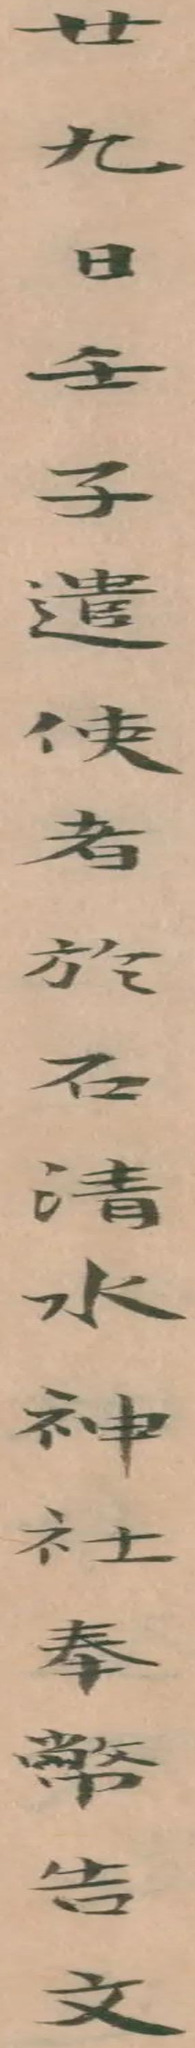二十九日壬子遣使者於石清水神社奉幣告文
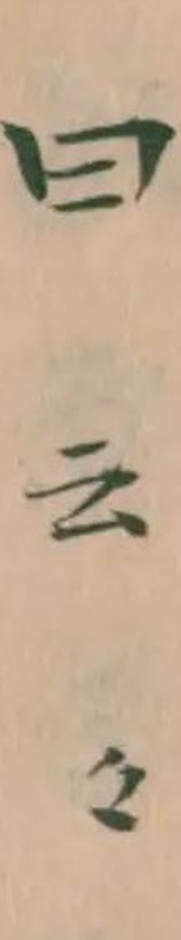曰云々
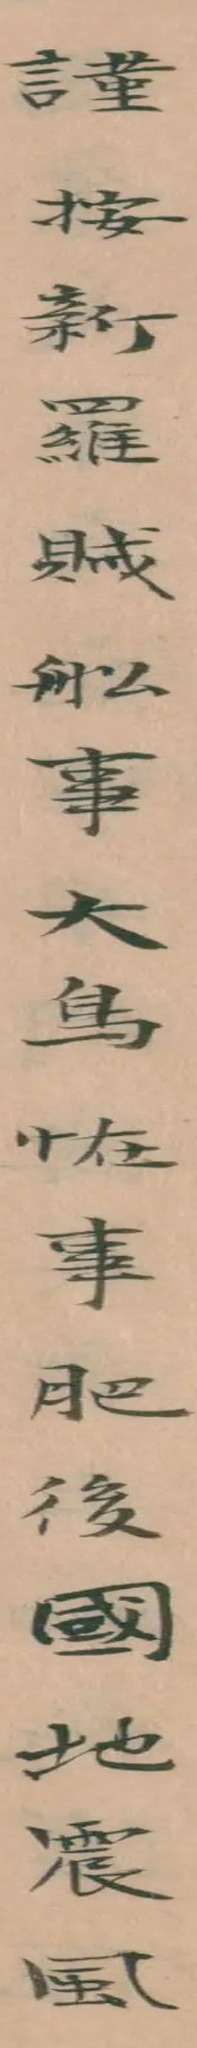謹按新羅賊船事大鳥怪事肥後国地震風
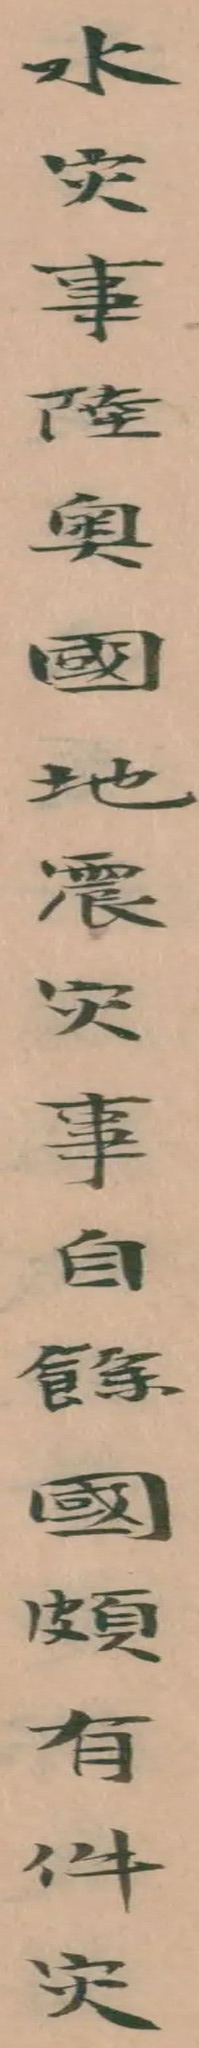水災事陸奥国地震災事自余国頗有件災
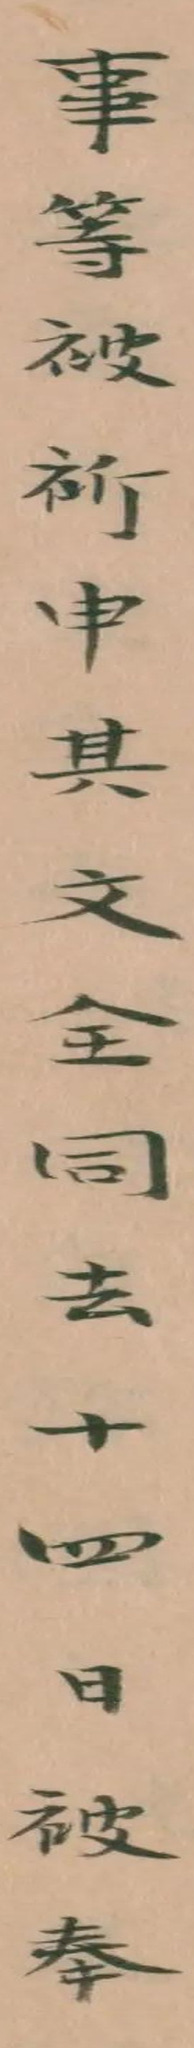事等被祈申其文全同去十四日被奉
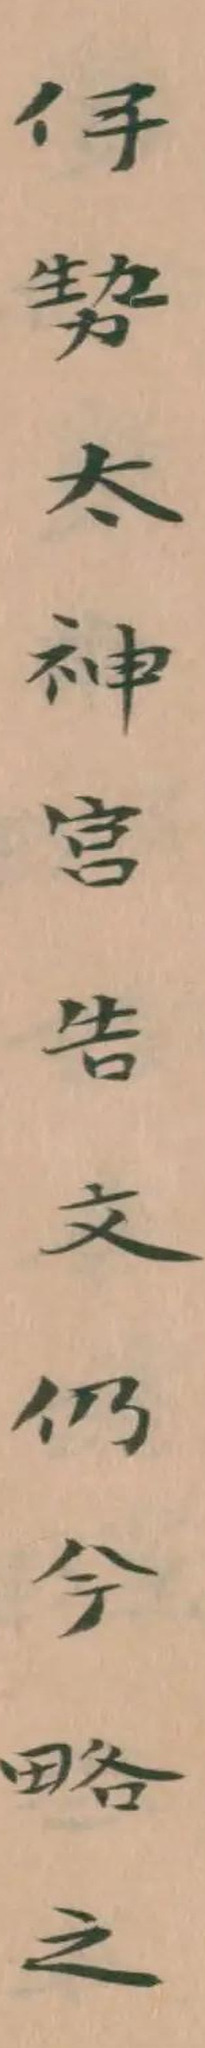伊勢太神宮告文仍今略之
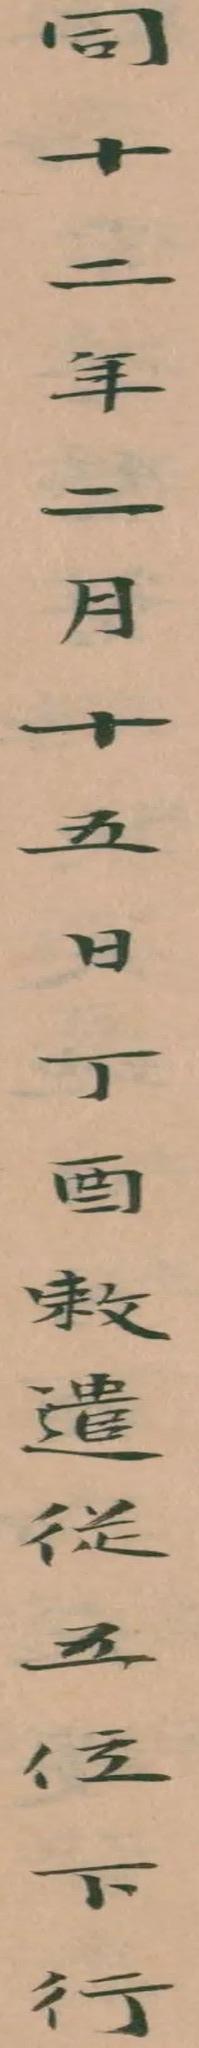同十二年二月十五日丁酉敕遣従五位下行
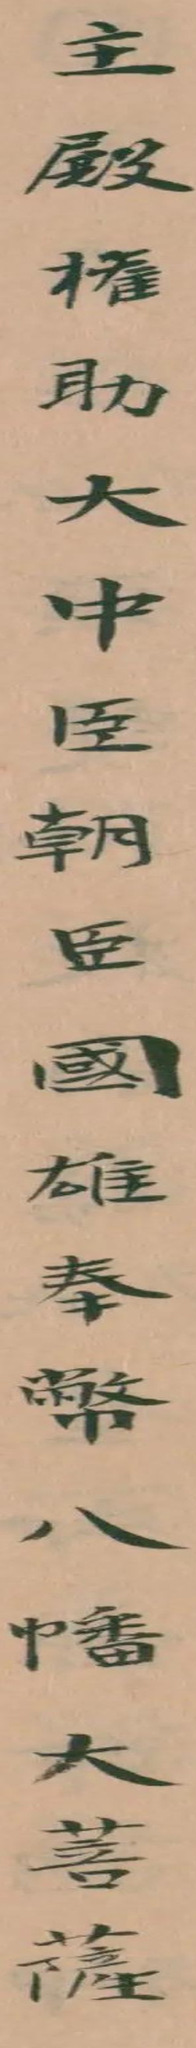主殿権助大中臣朝臣国雄奉幣八幡大菩薩
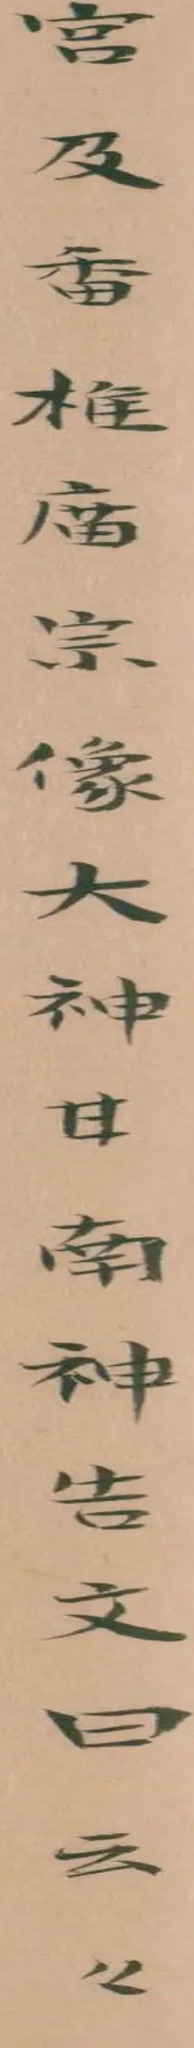宮及香椎廟宗像大神甘南神告文曰云々
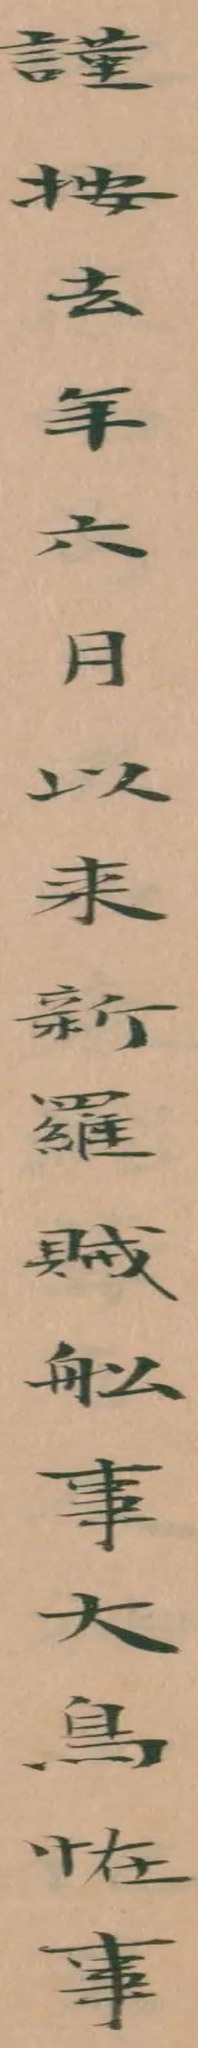謹按去年六月以来新羅賊船事大鳥怪事
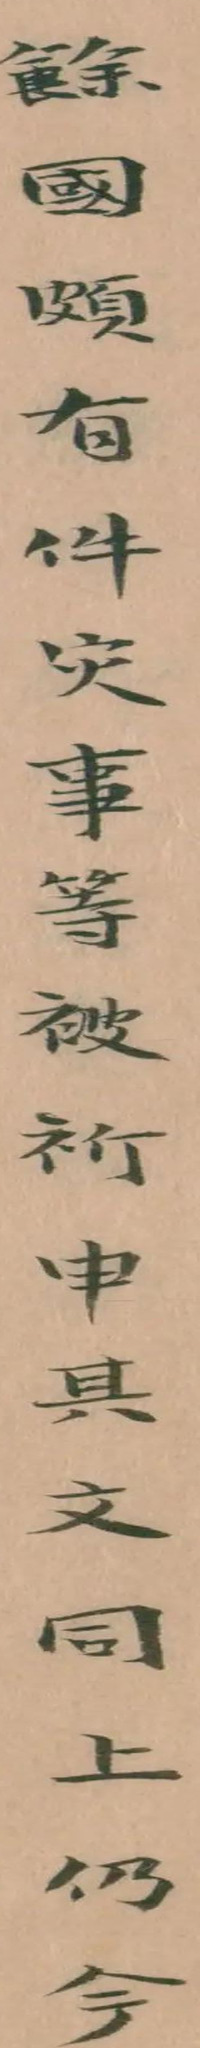余国頗有件災事等被祈申其文同上仍今
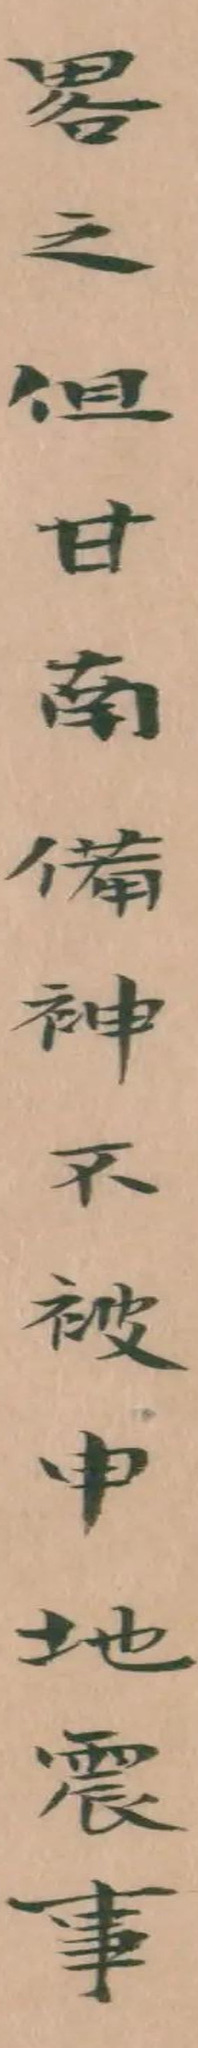略之但甘南備神不破申地震事
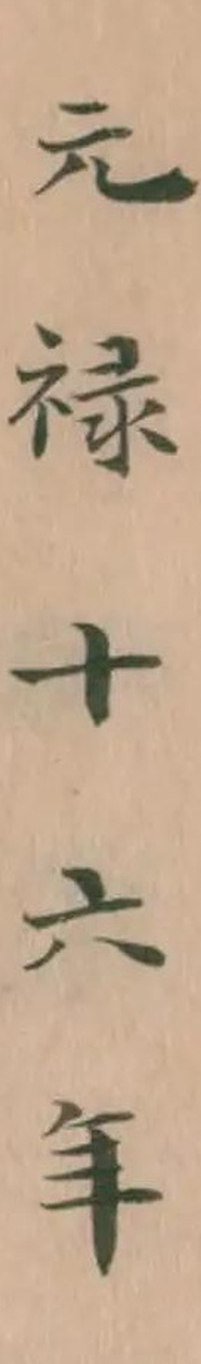元禄十六年
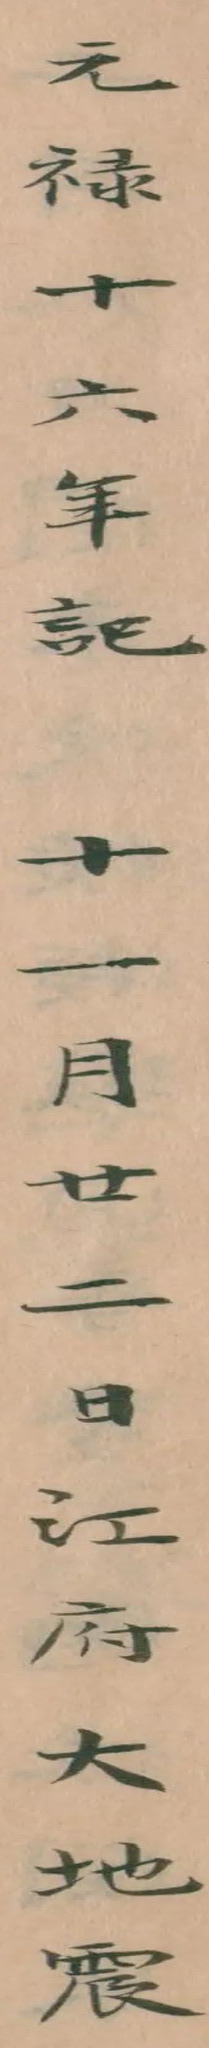元禄十六年記十一月廿ニ日江府大地震
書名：地災撮要. 巻5-6(地震之部)
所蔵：国立国会図書館 National Diet Library, JAPAN
